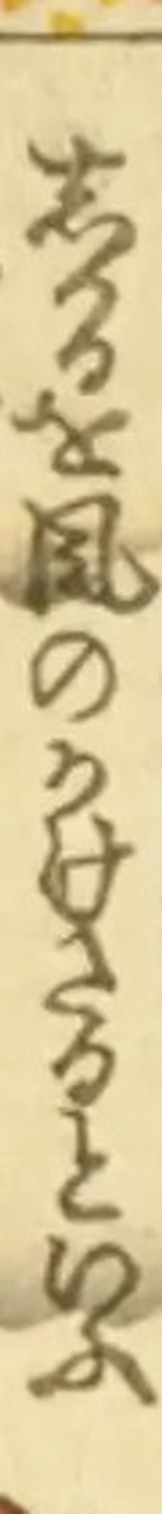しかるを風のかけたるといふ
